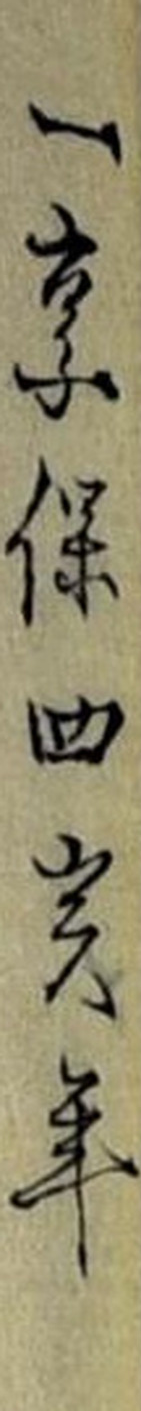一享保四亥年
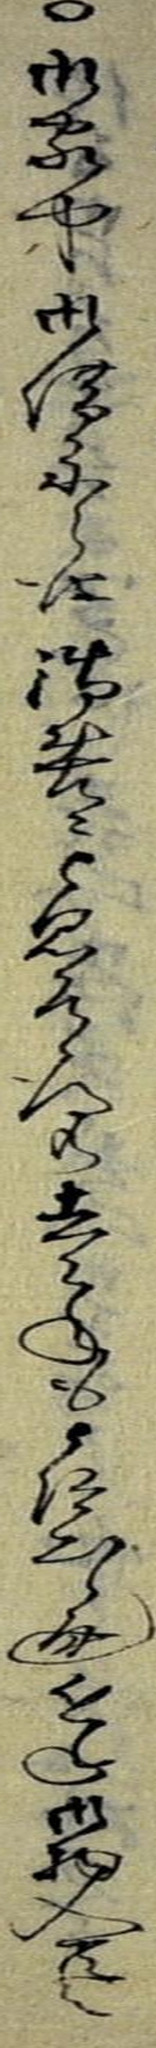〇御家中御借米之儀御苦ニ被思召候得共去々年も被仰出候通近年御物入共之
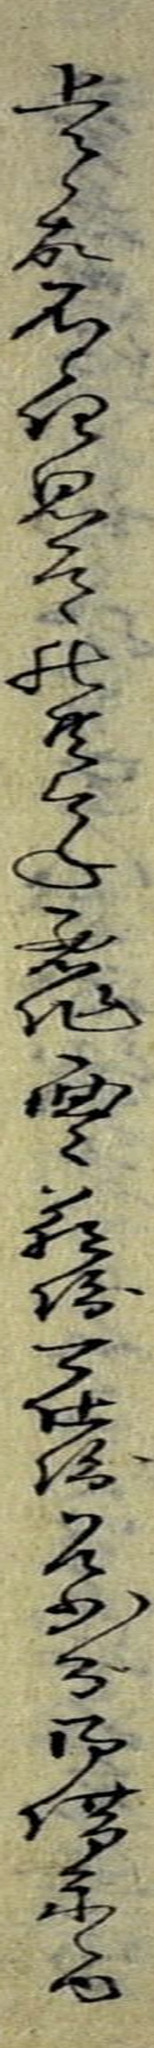上ニ候故不被任思召候然共今年悪作面々難儀可仕儀乍少分御借米之内
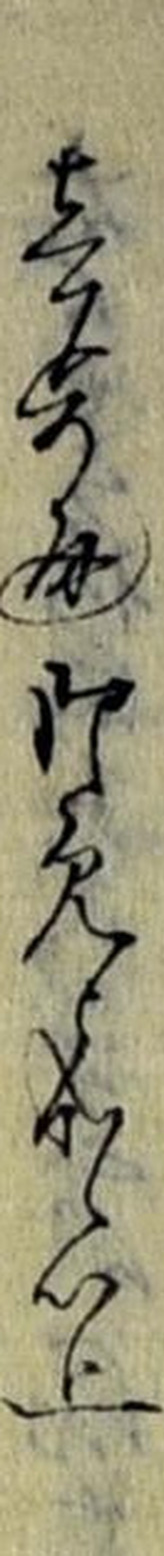壱歩通御免被成候以上
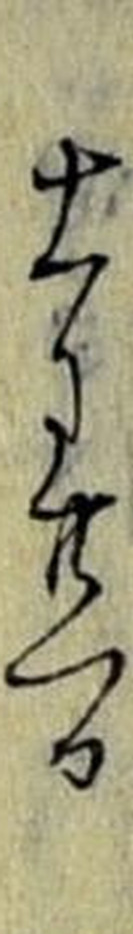十一月廿一日

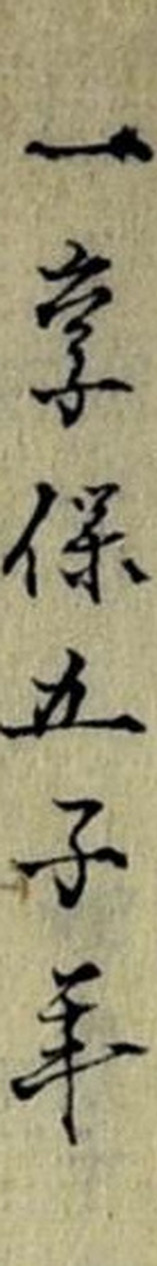一享保五子年
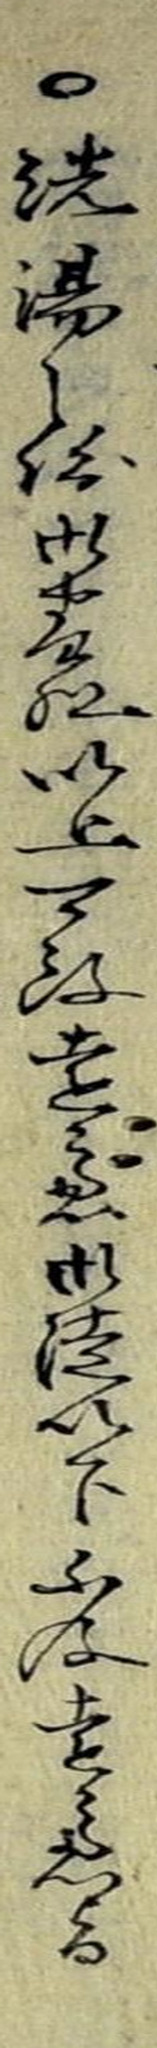〇洗湯之儀御番組以上可致遠慮御徒以下不及遠慮旨
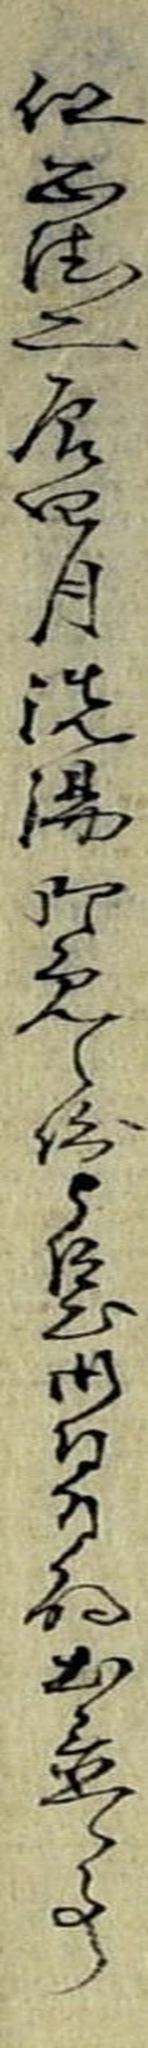但正徳二辰四月洗湯御免之儀被仰出御目付触出置候事
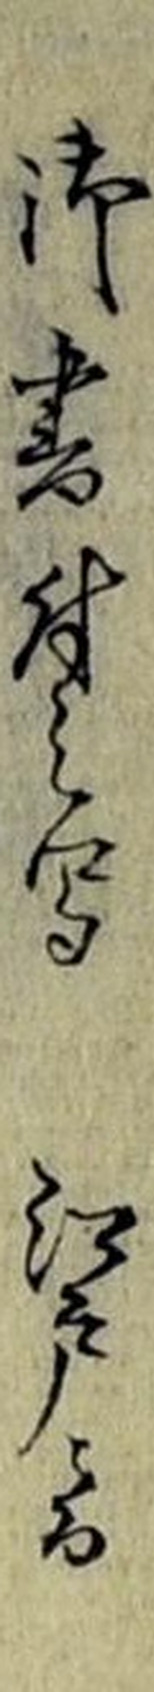御書付之写江戸ニ而
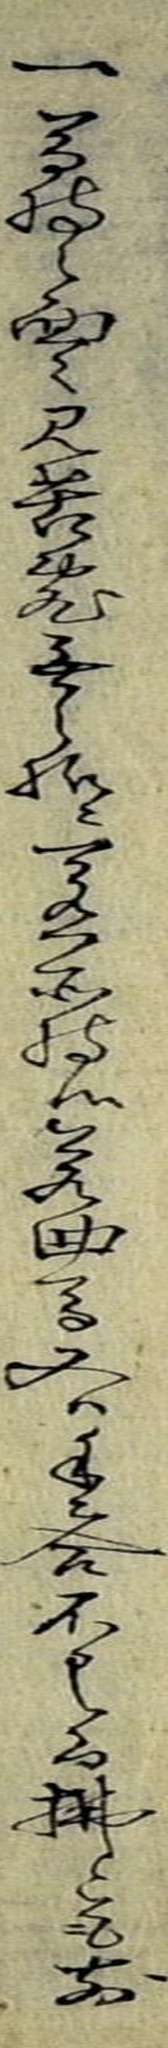一馬持之面々見苦敷無之様ニ可有所持候若曲馬又ハ手ニ合不申候而払候とも前
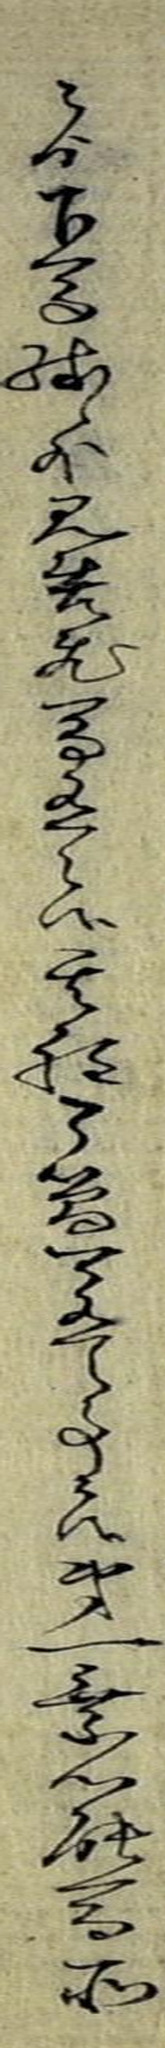々ゟ下馬殊之外見苦敷馬有之候其程了簡可有之事ニ候第一乗心能馬所
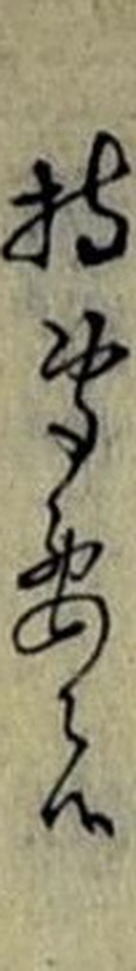持専要ニ候
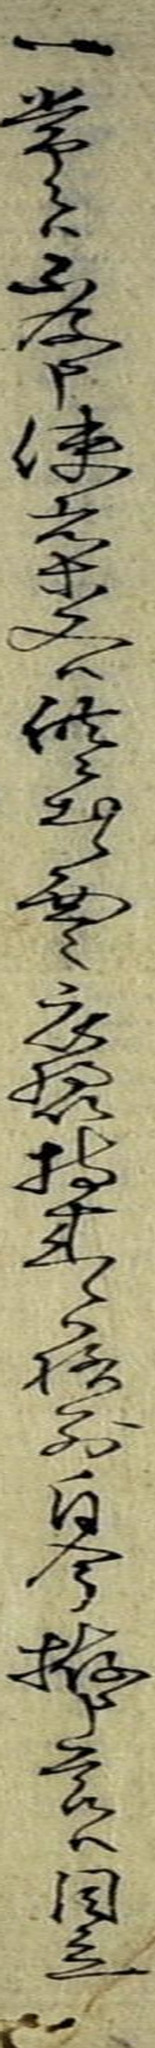一常々ハ不及申使者等又ハ供ニ出候面々衣装持来候ハ格別自今拵申節ハ目立
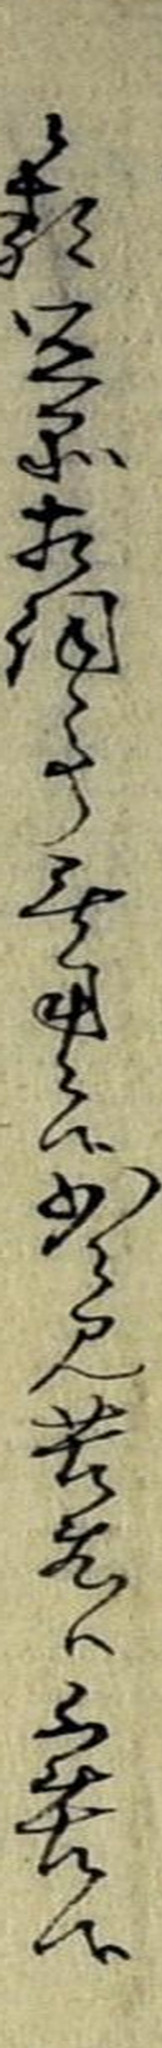候類宜品相調候事無用ニ候少々見苦敷ハ不苦候
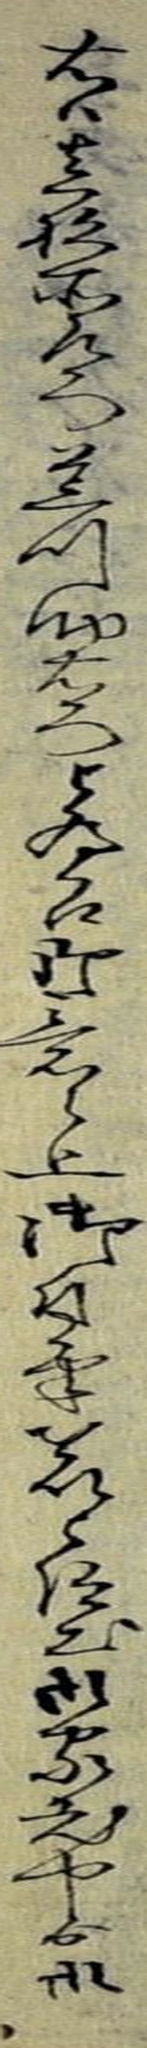右ハ真杉所左衛門荒川助右衛門被為召御意之上御自筆を以被仰出御家老中ゟ御
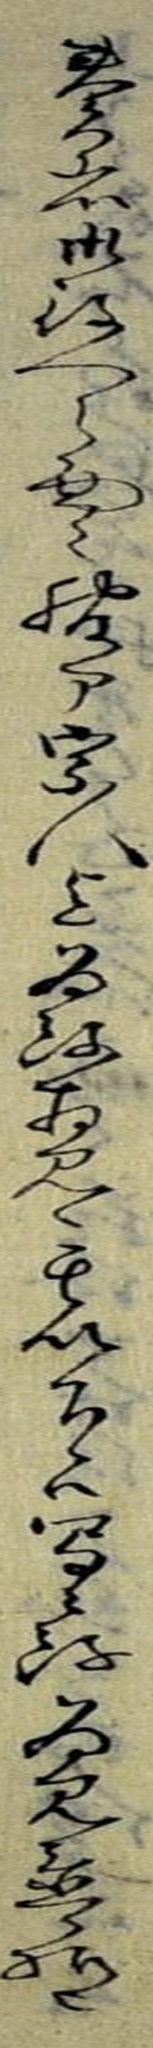奏者御役人之面々服部宗八迄為致拝見候其以下ヘハ写ニ致為見置候様被
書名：命令之部 一
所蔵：福井県文書館 Fukui Prefectural Archives
